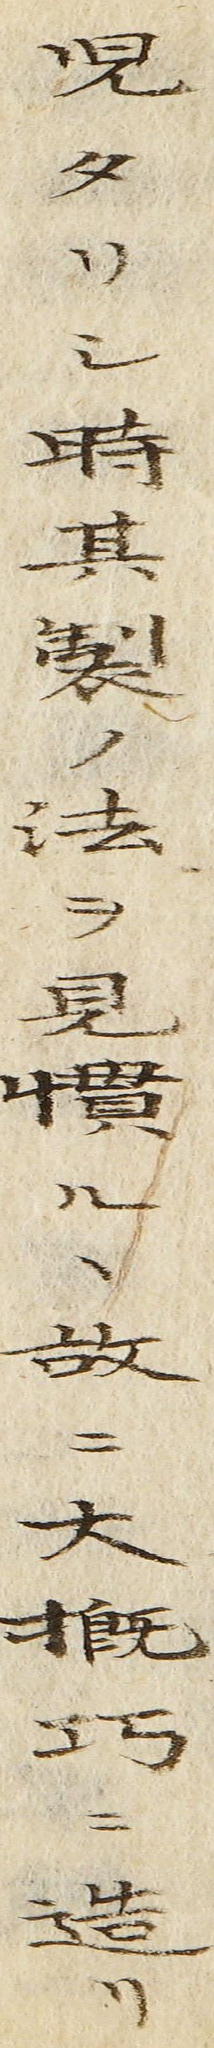児タリシ時其製ノ法ヲ見慣ルヽ故ニ大概巧ニ造リ
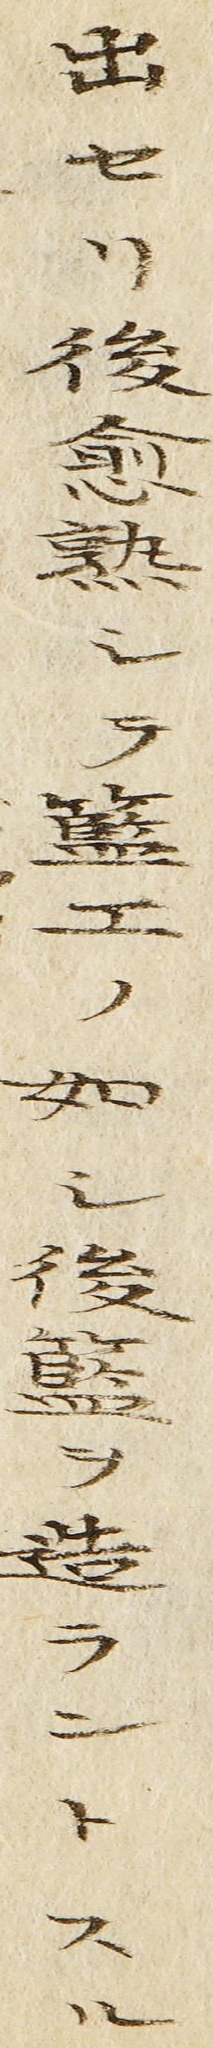出セリ後愈熟シテ籃工ノ如シ後籃ヲ造ラントスル
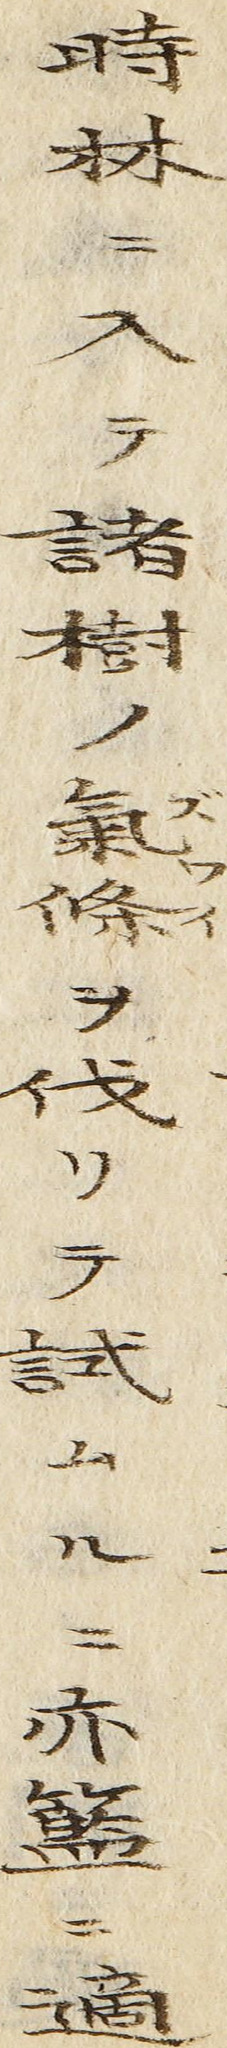時林ニ入テ諸樹ノ気條ヲ伐リテ試ムルニ亦籃ニ適
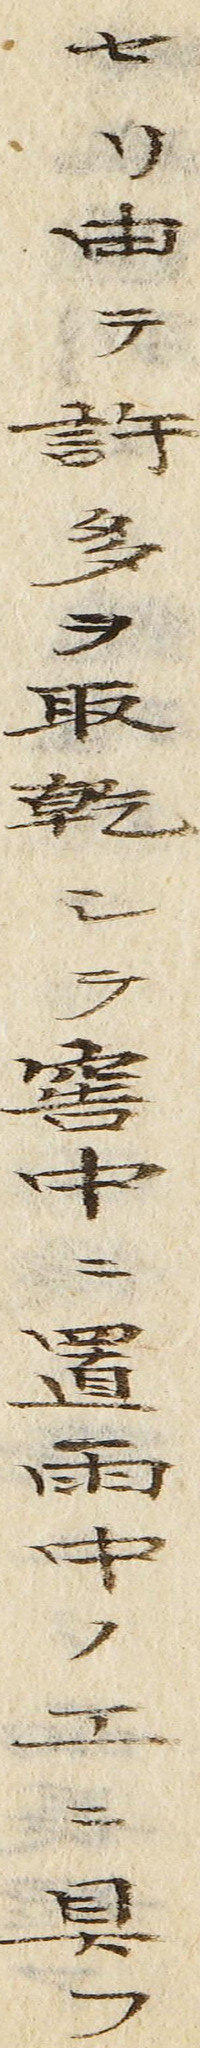セリ由テ許多ヲ取乾シテ窖中ニ置雨中ノ工ニ具フ
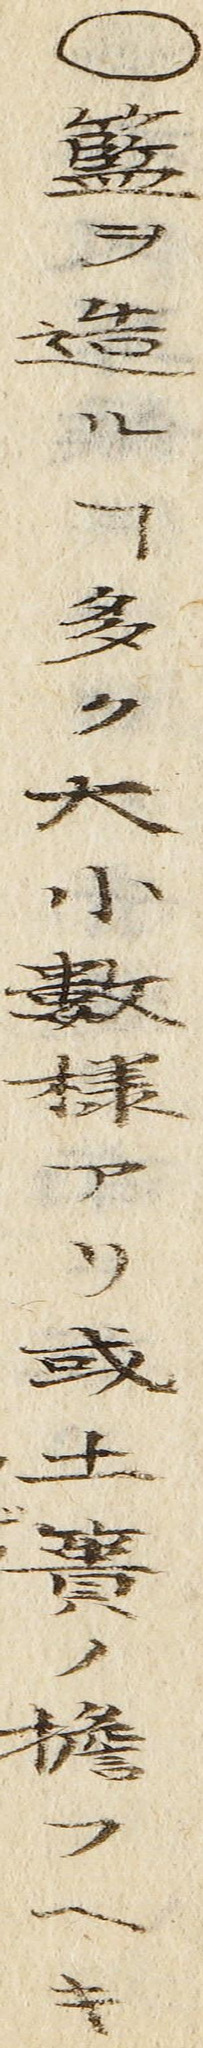◯籃ヲ造ルコト多ク大小数様アリ或土簣ノ担フヘキ
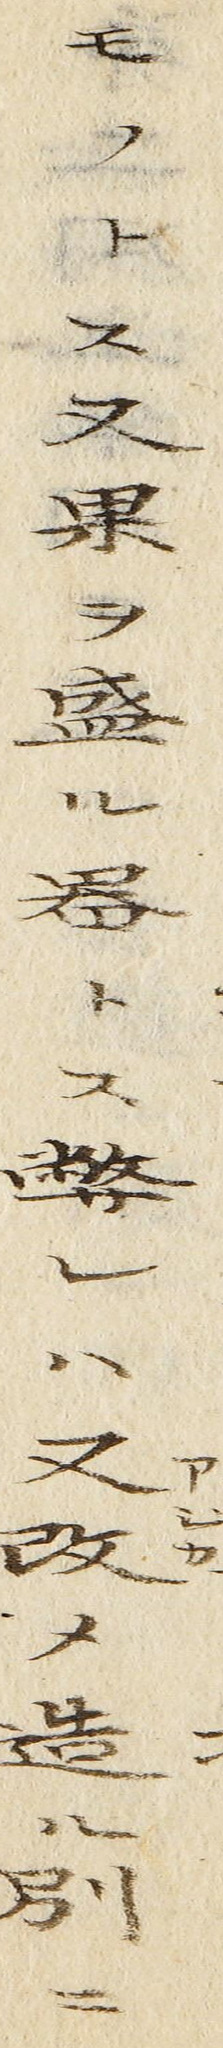モノトス又果ヲ盛ル器トス弊レハ又改メ造ル別ニ
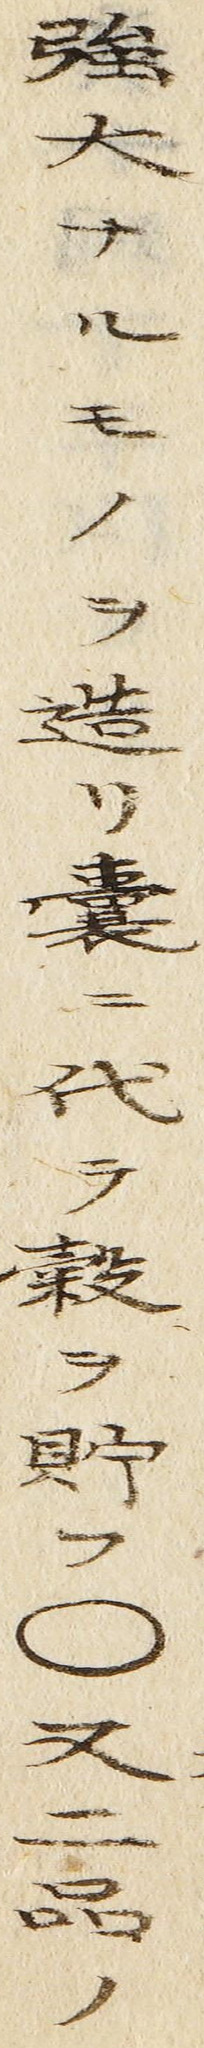強大ナルモノヲ造リ嚢ニ代テ穀ヲ貯フ◯又二品ノ
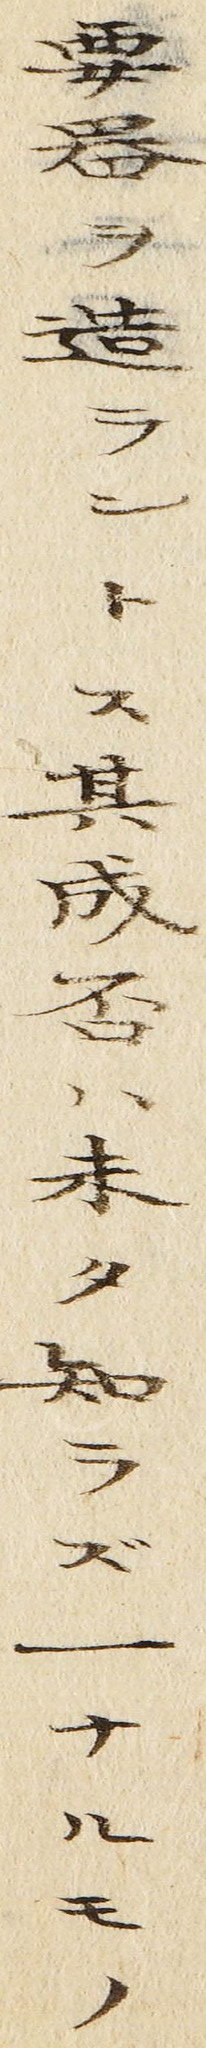要器ヲ造ラントス其成否ハ未タ知ラズ一ナルモノ
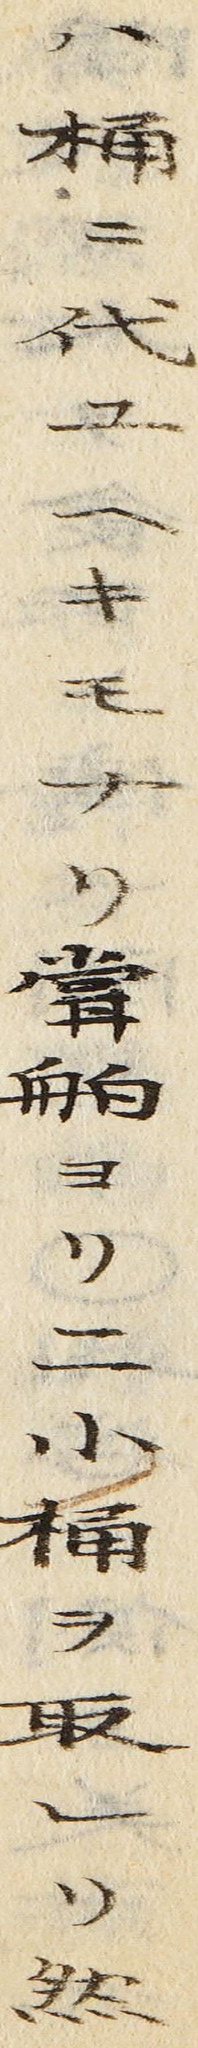ハ桶ニ代ユヘキモナリ嘗舶ヨリ二小桶ヲ取レリ然
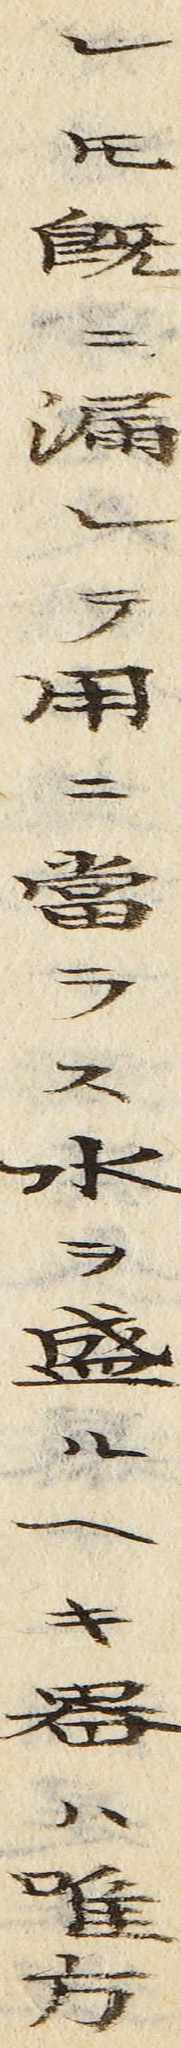レトモ既ニ漏レテ用ニ当ラス水ヲ盛ルヘキ器ハ唯方
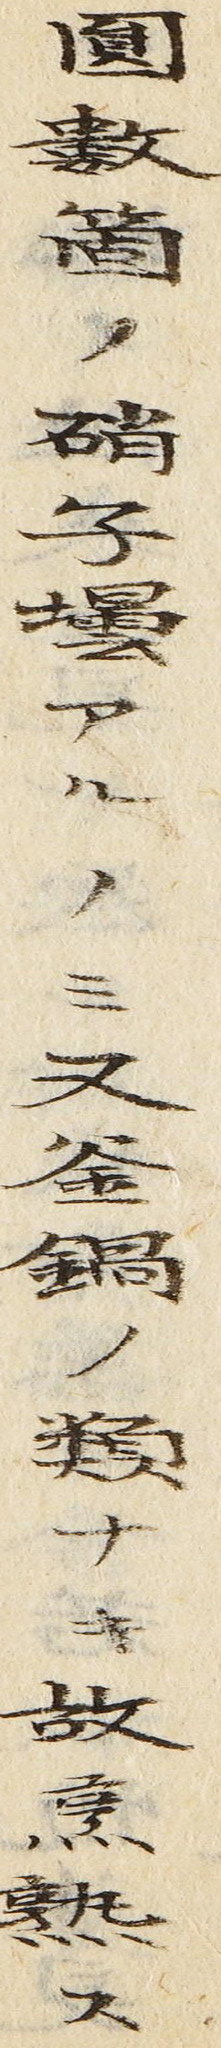円数箇ノ硝子壜アルノミ又釜鍋ノ類ナキ故烹熟ス
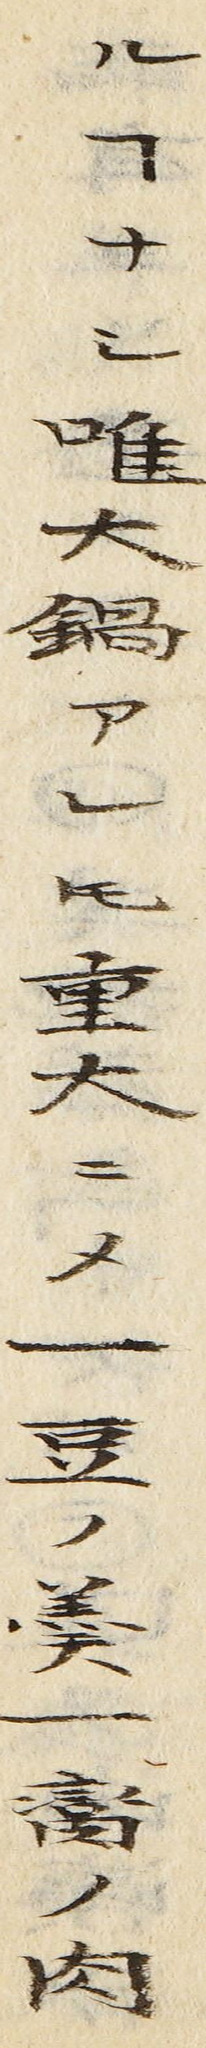ルコトナシ唯大鍋アレトモ重大ニシテ一豆ノ羹一臠ノ肉
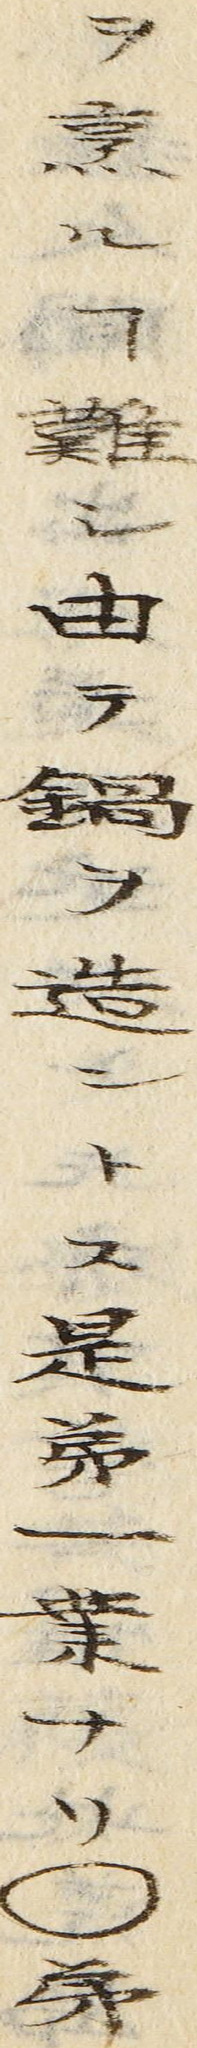ヲ烹ルコト難シ由テ鍋ヲ造ントス是第一業ナリ◯第
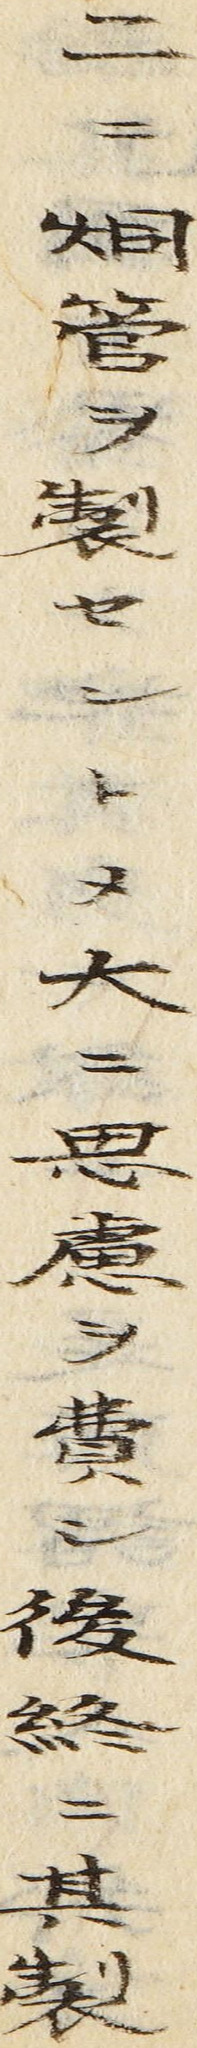二ニ煙管ヲ製セントシテ大ニ思慮ヲ費シ後終ニ其製
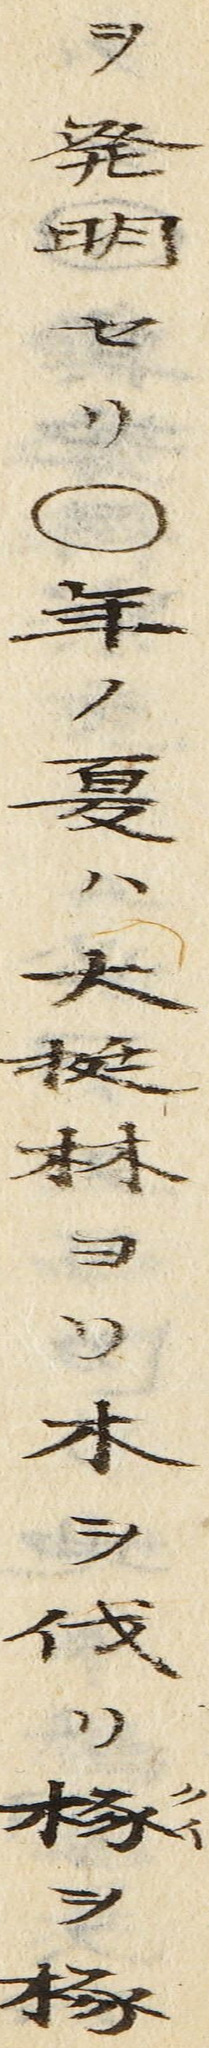ヲ発明セリ◯年ノ夏ハ大挺林ヨリ木ヲ伐リ椓ヲ椓
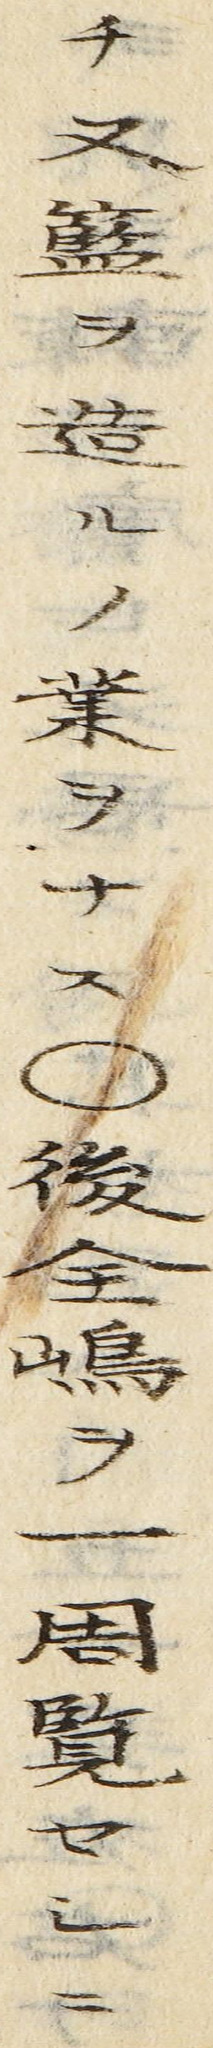チ又籃ヲ造ルノ業ヲナス◯後全島ヲ一周覧セシニ
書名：漂流紀事
